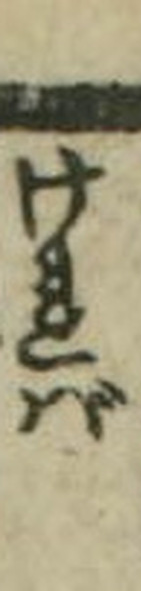ければ
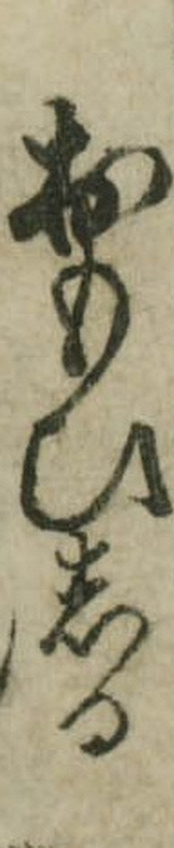おもひしる
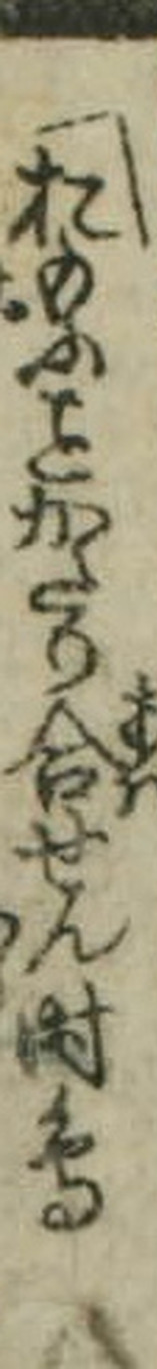〽おもうことかたり合せん時鳥
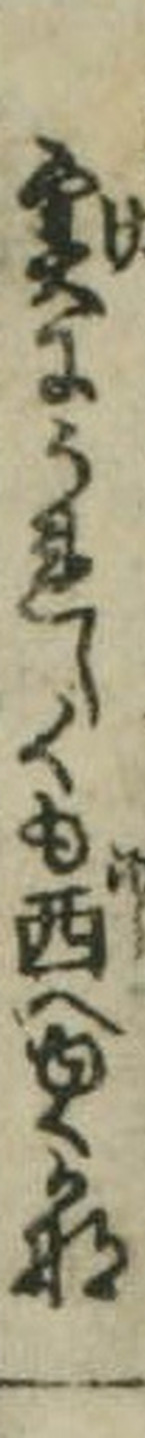実にうれしくも西へゆくかな
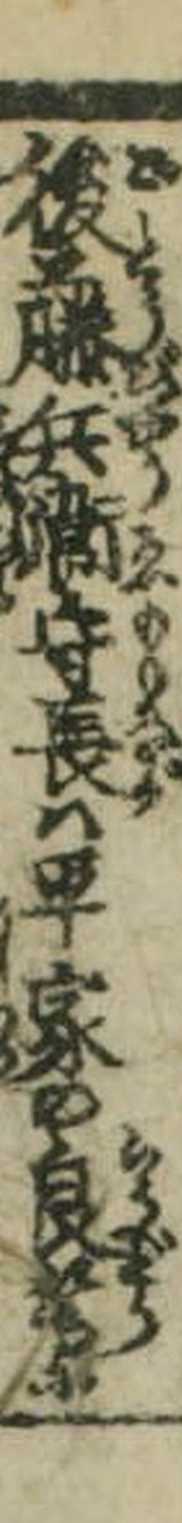後藤兵衛守長は平家の郎等に
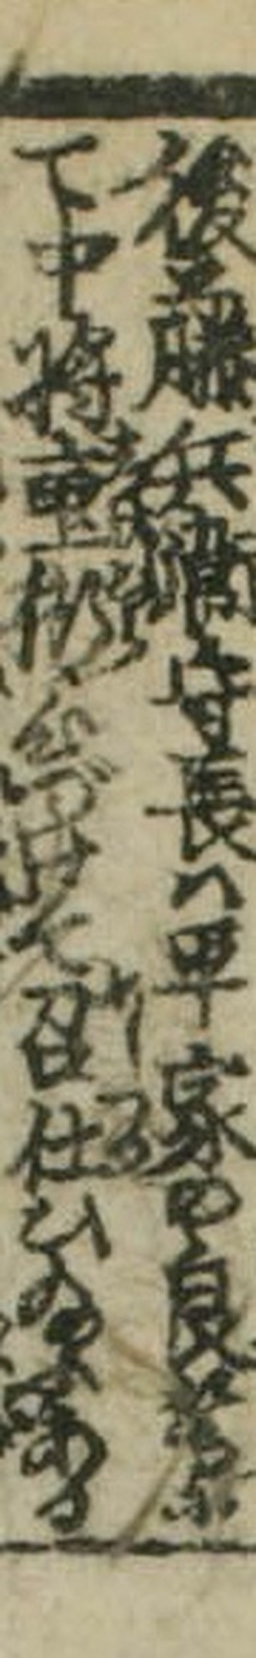て中将重衡心づけて召仕ひ給ふある
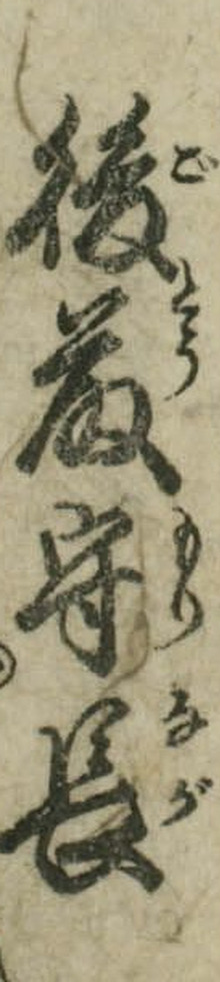後藤守長
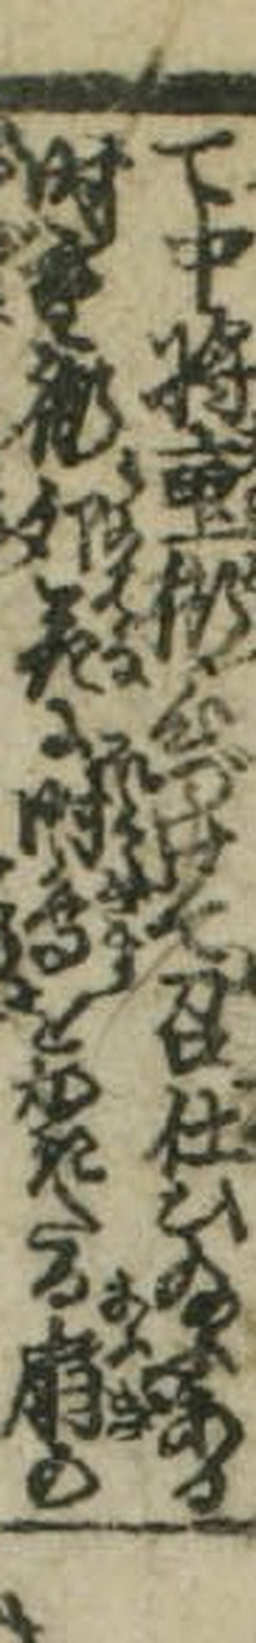時重衡卯花に時鳥をかきたる扇の
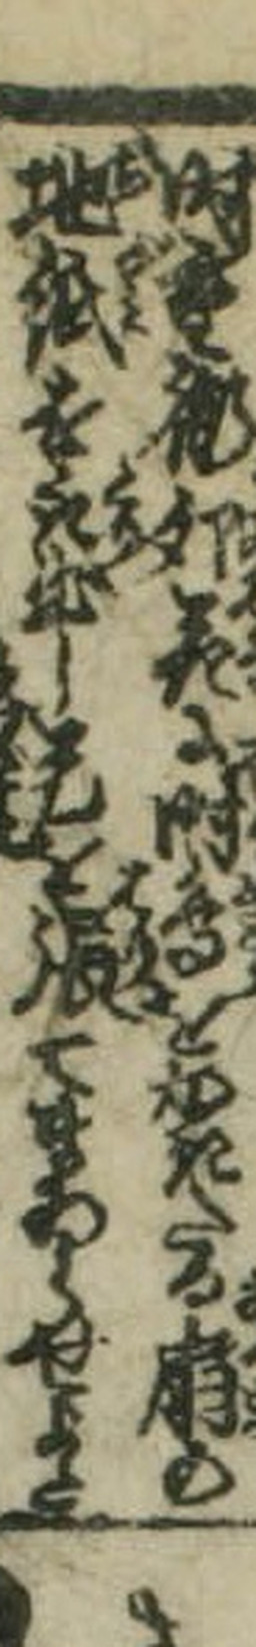地紙を取出し是を張てまゐらせよと
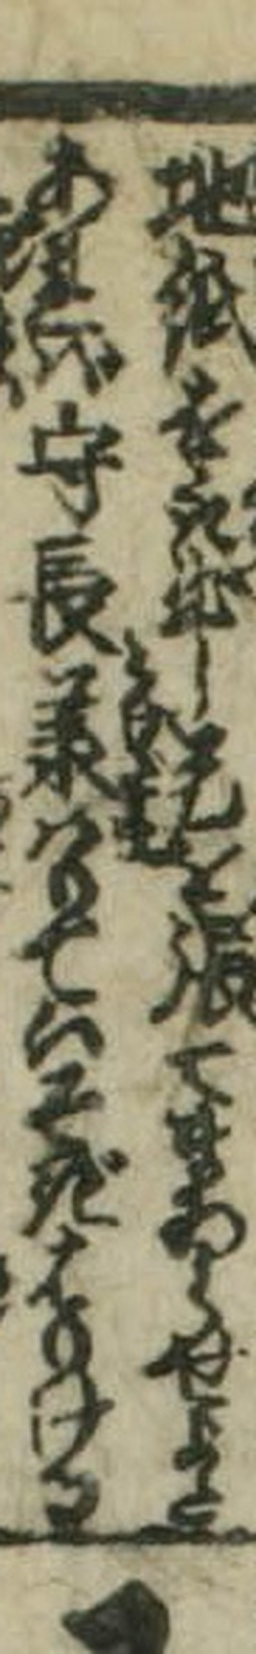あれば守長承はりていそぎはりける
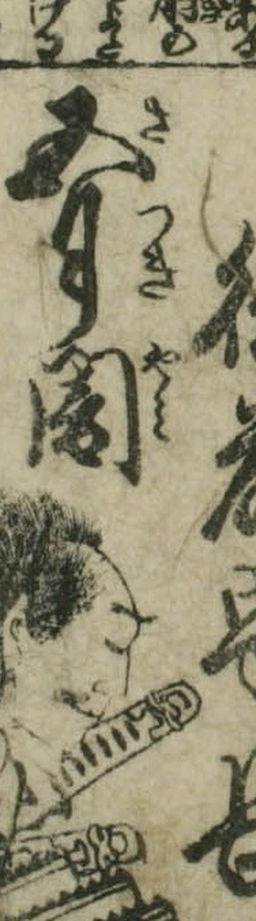五月闇
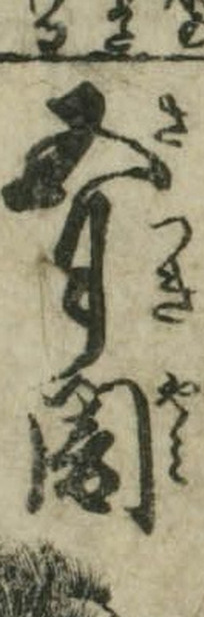五月闇
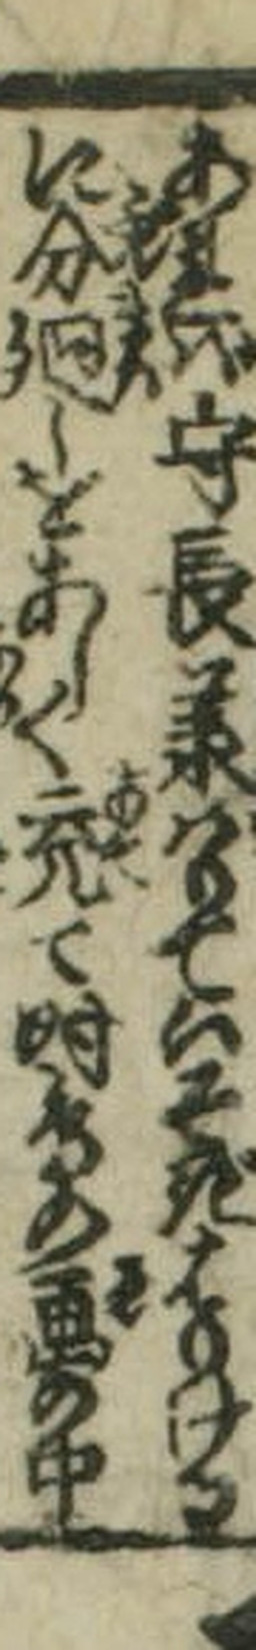に分廻しをあしく充て時鳥の画の中
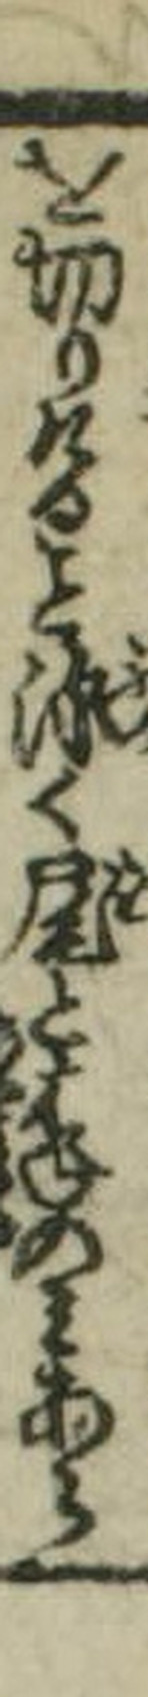を切りけること深く尾とはねのみあら
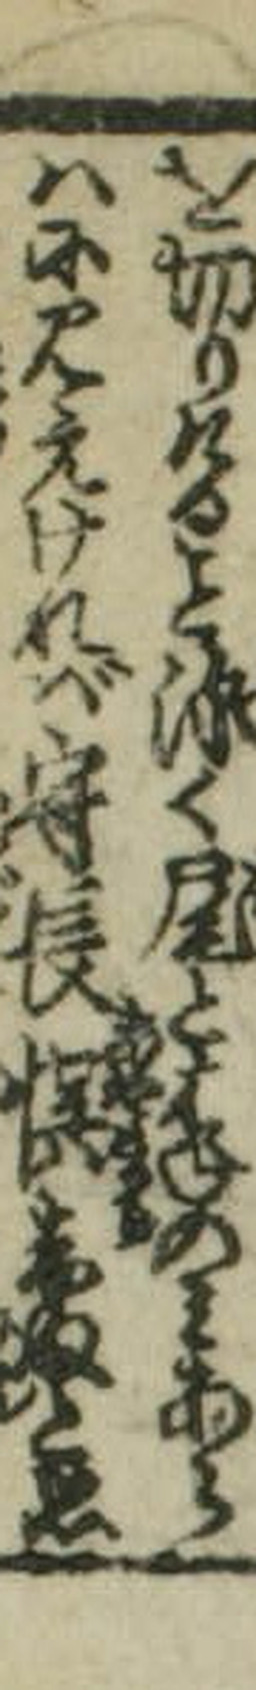はに見えければ守長誤しぬと思
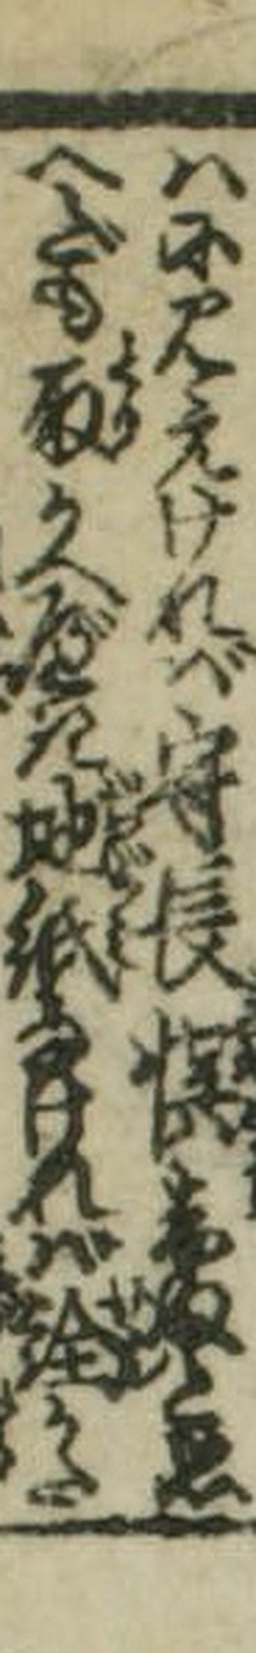へども取かへべき地紙なければ詮かた
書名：續英雄百人一首
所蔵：東京学芸大学附属図書館
